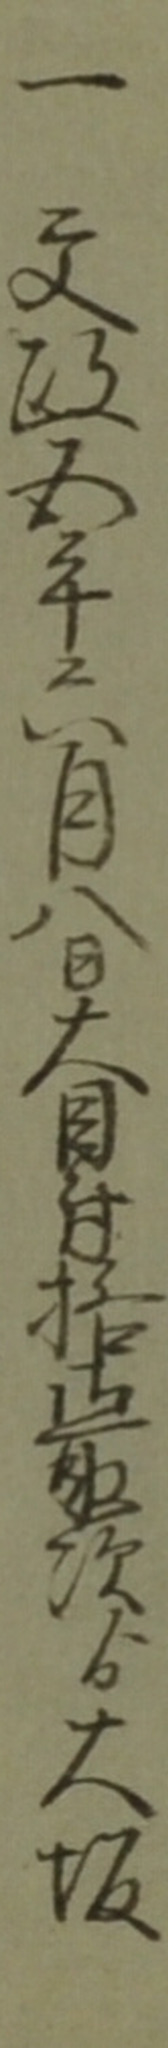一文政五午六月八日大目付格御取次ゟ大坂
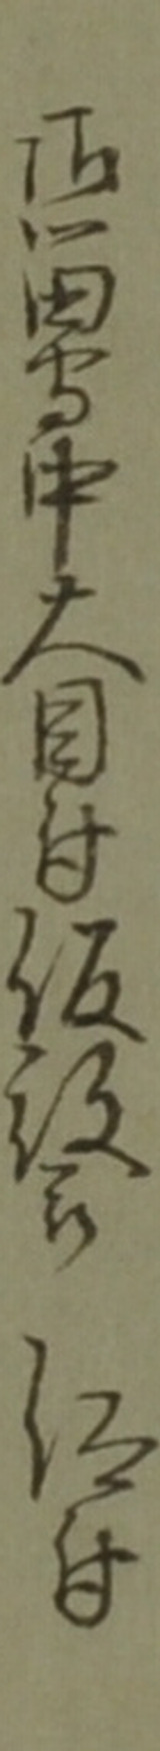御留守中大目付仮役被仰付
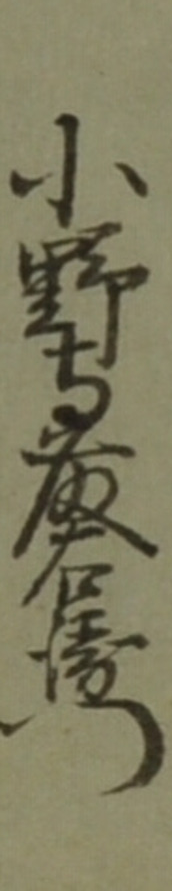小野寺藤右衛門
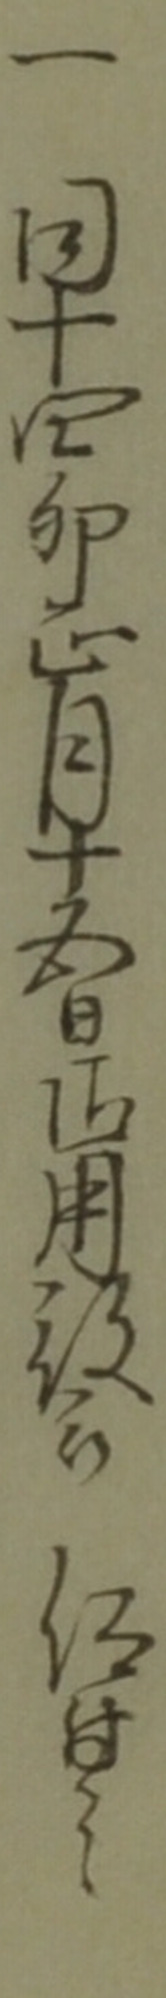一同十四卯正月十五日御用役被仰付之
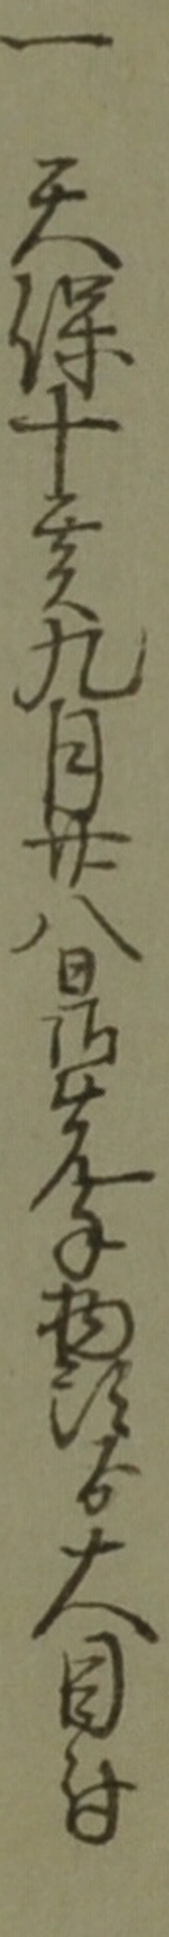一天保十亥九月廿八日御先手物頭ゟ大目付
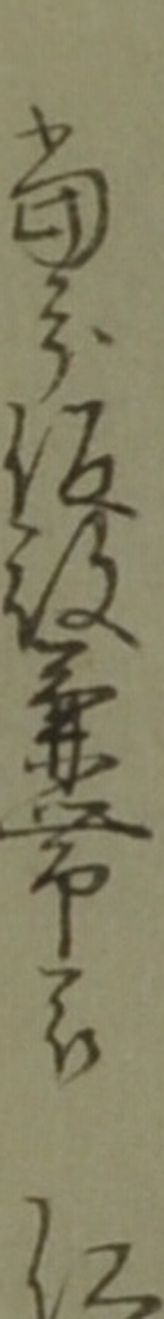当分仮役兼帯被仰付
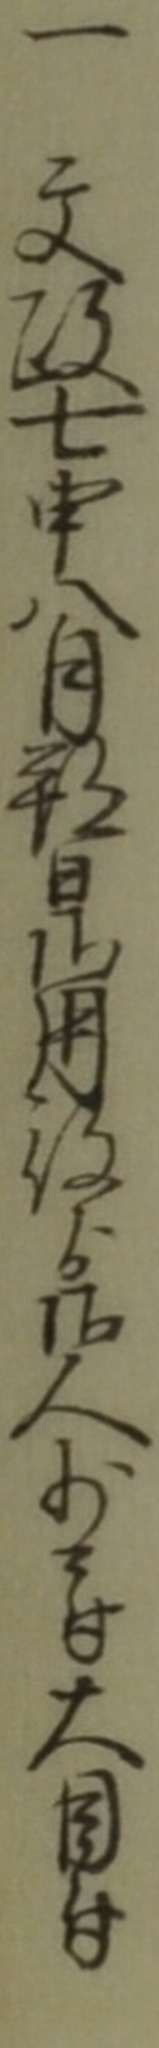一文政七申朔日御用役ゟ御人少ニ付大目付
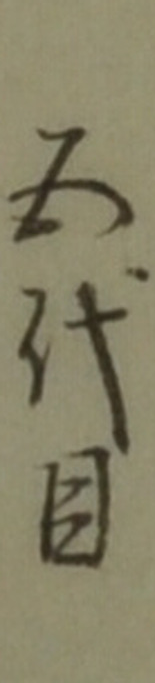五代目
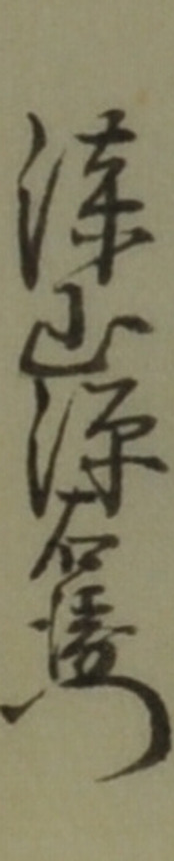漆山源右衛門
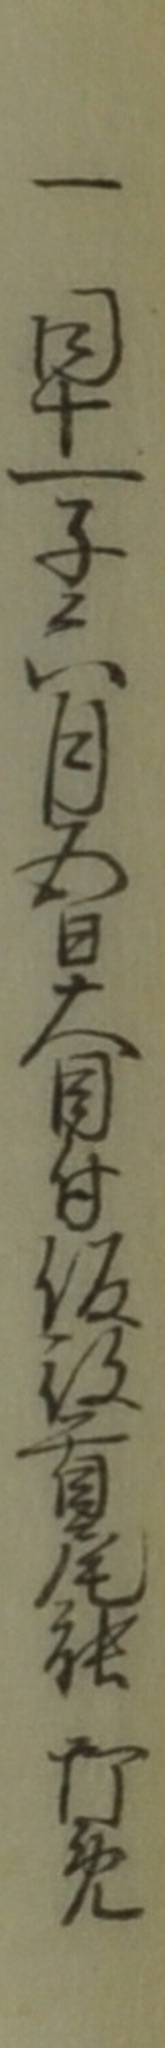一同十一子六月五日大目付仮役首尾能御免
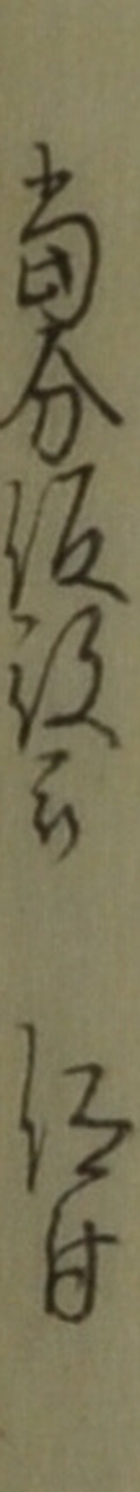当分仮役被仰付
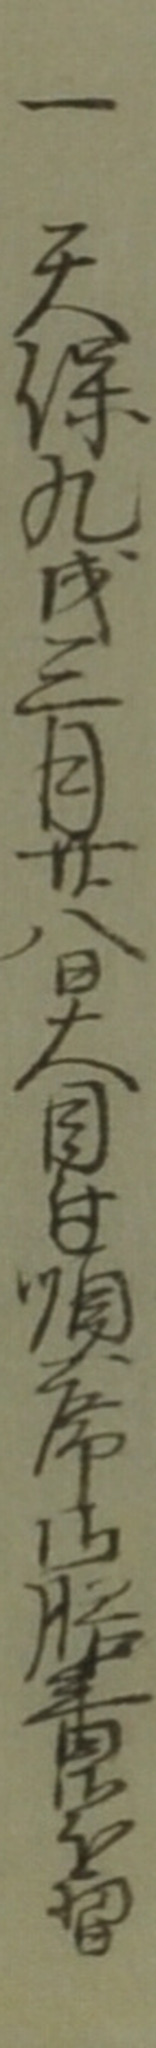一天保九戌三月廿八日大目付順席御膳番御近習
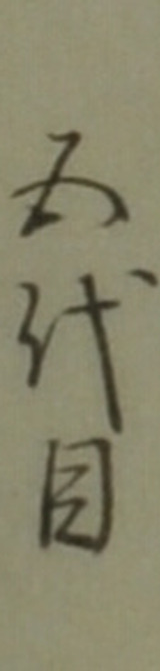五代目
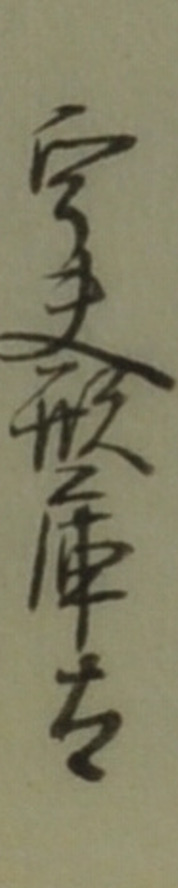宇夫形庫太
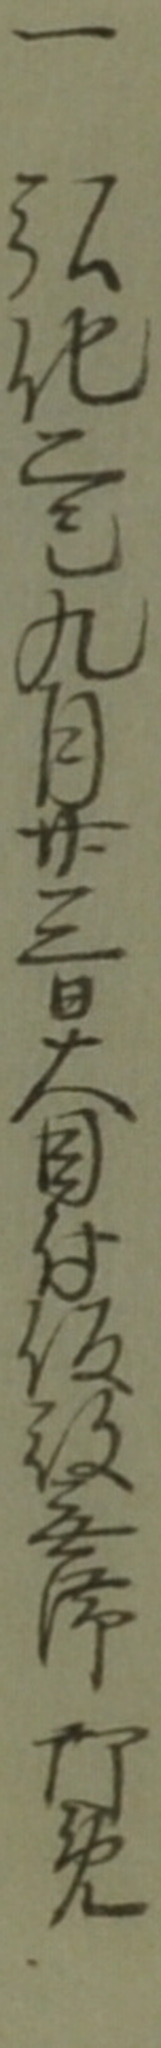一弘化二巳九月廿三日大目付仮役無滞御免
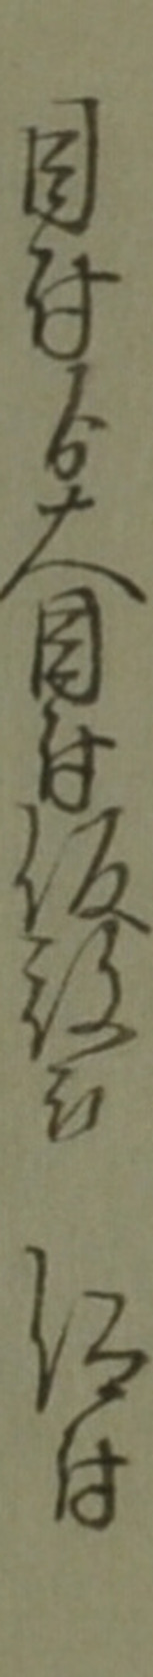目付ゟ大目付仮役被仰付
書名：諸御役代々録（三）
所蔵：伊那市立高遠町図書館・合同会社AMANE
